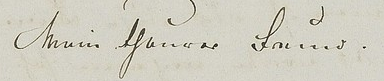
Mein theurer Freund.
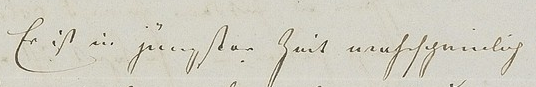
Es ist in jüngster Zeit wahrscheinlich
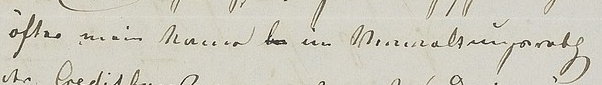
öfter mein Name im Verwaltungsrath
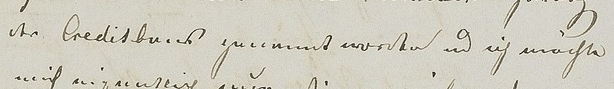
der Creditbank genannt worden und ich möchte
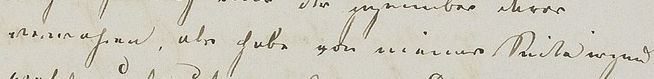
verwahren, als habe von meiner Seite irgend
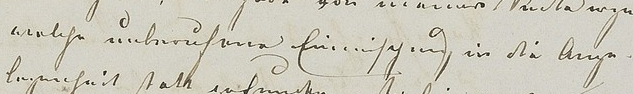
welche unberufene Einmischung in die Ange-
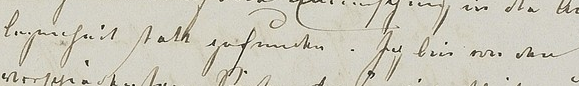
legenheit statt gefunden. Ich bin von den
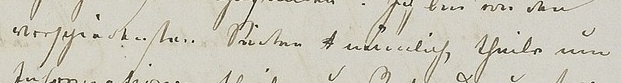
verschiedensten Seiten nämlich, theils um
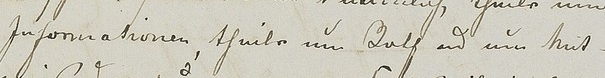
Informationen, theils um Rath und um Mit-
